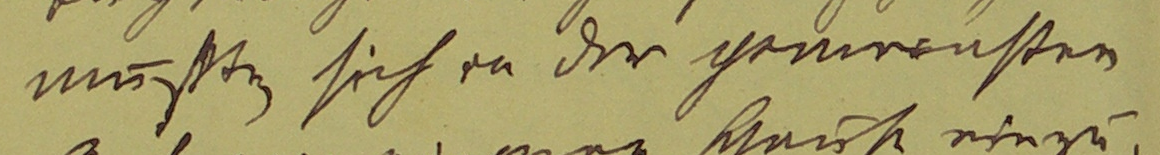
mußte, sich in der gemeinsten
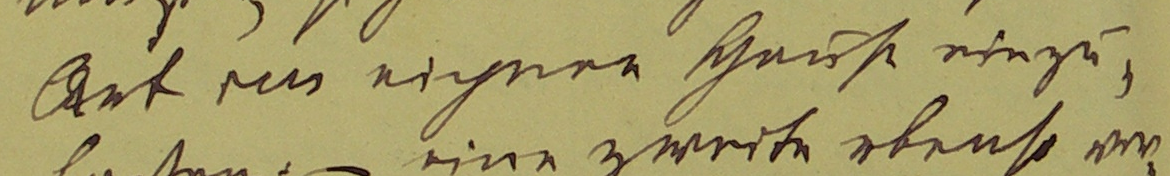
Art im eigenen Hause einzu¬
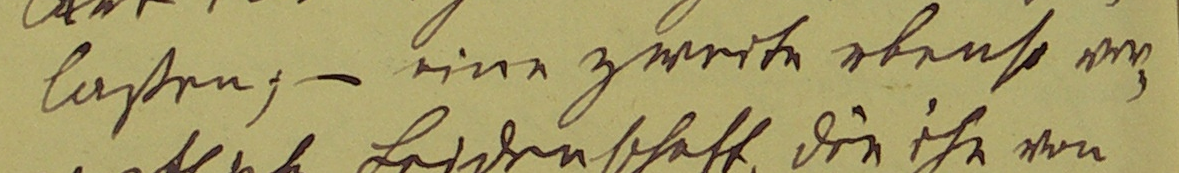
laßen; -- eine zweite ebenso ver¬
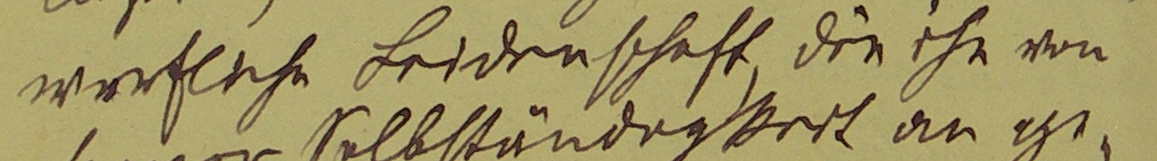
werfliche Leidenschaft die ihn von
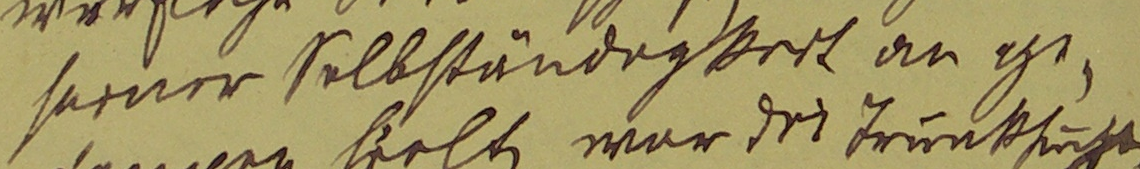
seiner Selbstständigkeit an ge¬
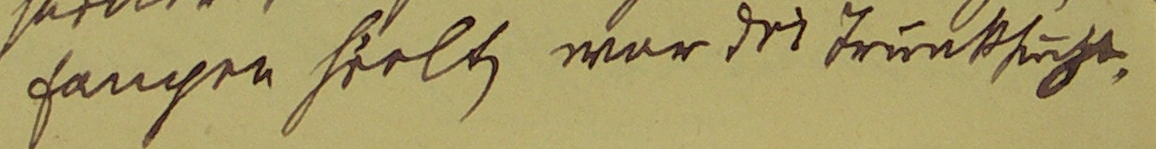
fangen hielt, war die Trunksucht.
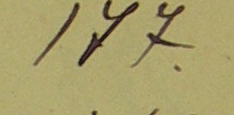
177
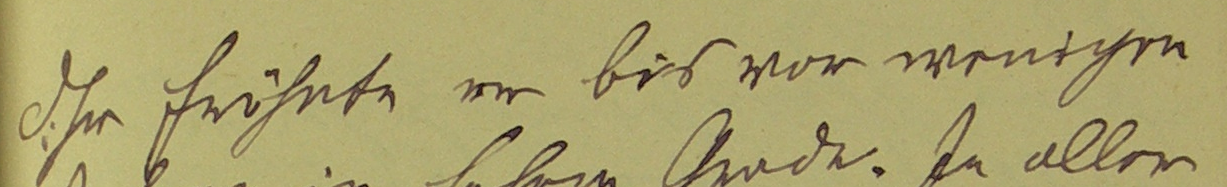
Dser fröhnte er bis vor wenigen
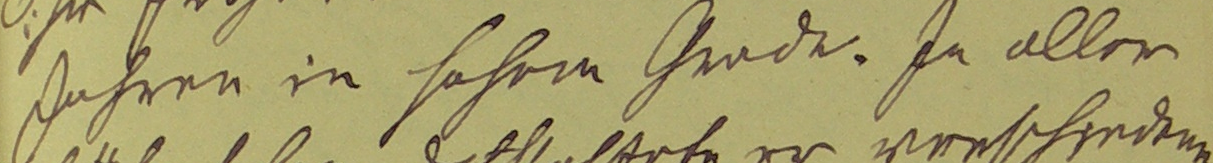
Jahren in hohem Grade. In aller
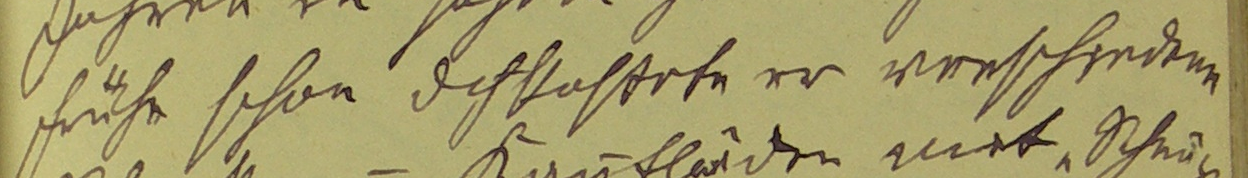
frühe schon dchkostete er verschiedene
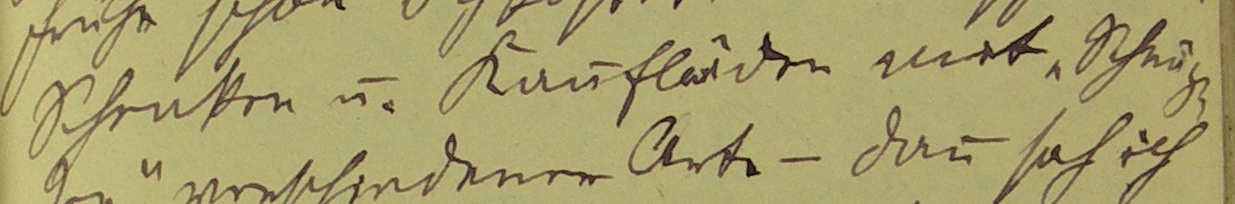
Schenken u. Kaufläden mit ???
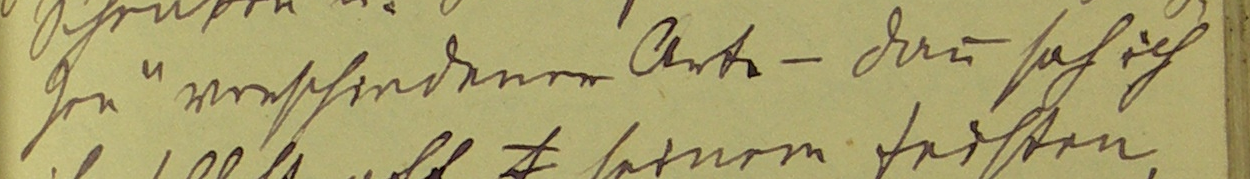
??? verschiedener Art.- Dann sah ich
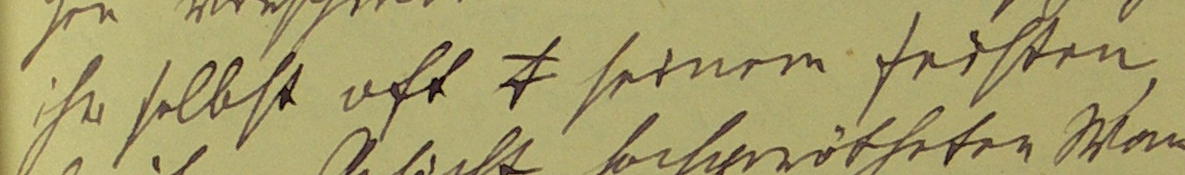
ihn selbst oft t seinem feisten,
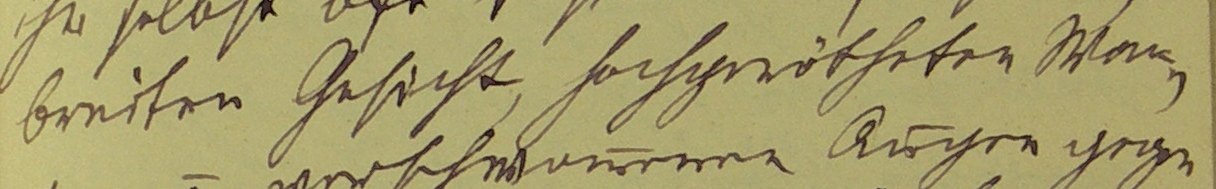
breiten Gesicht, hochgerötheten Wan¬
